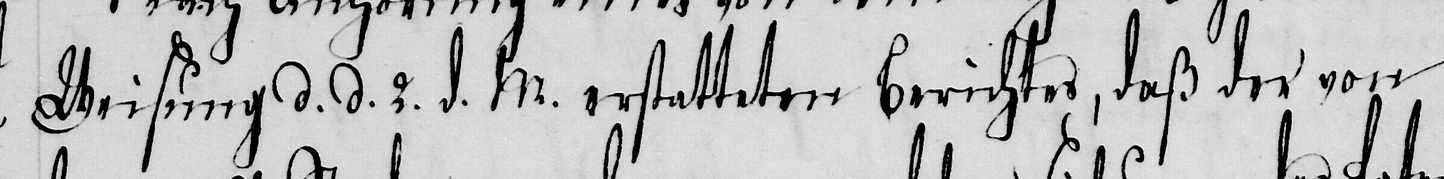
Weisung d. d. 2. d. M. erstatteten Berichtes, daß der von
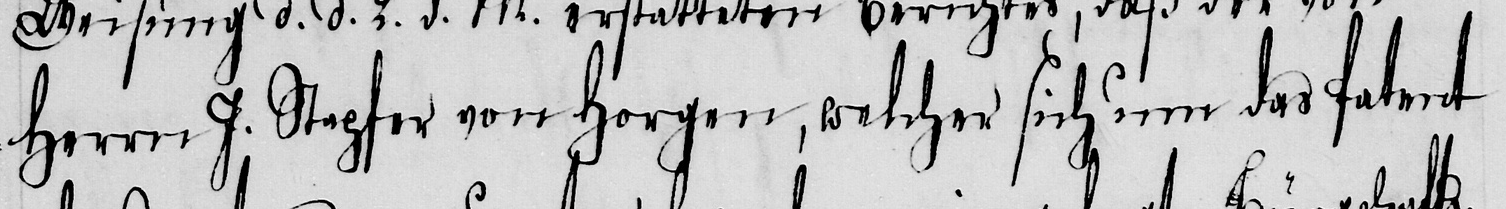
Herrn J. Stapfer von Horgen, welcher sich um das Patent
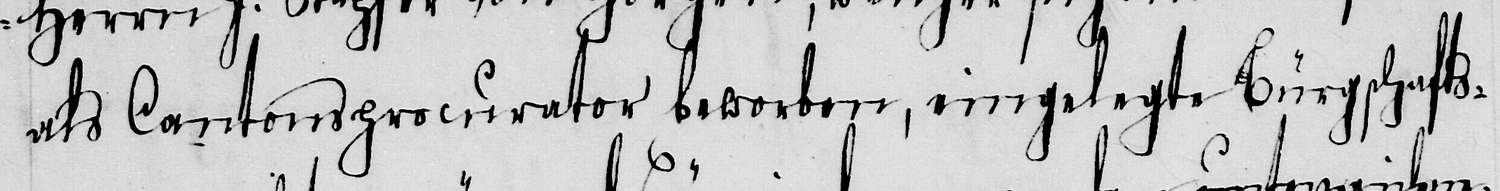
als Cantonsprocurator beworben, eingelegte Bürgschafts¬
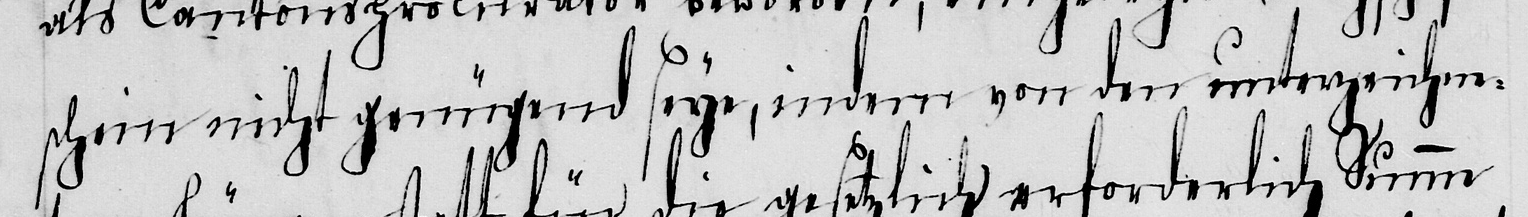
schein nicht genügend seye, indem von den unterzeichne¬
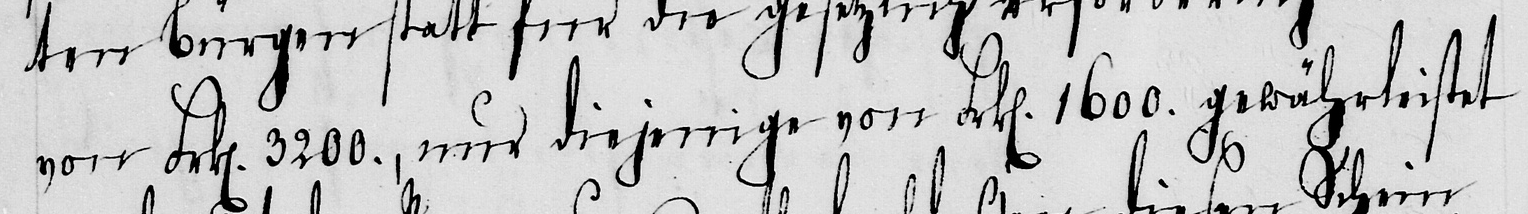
von Frk[en]. 3200., nur diejenigen von Frk[en]. 1600. gewährleistet
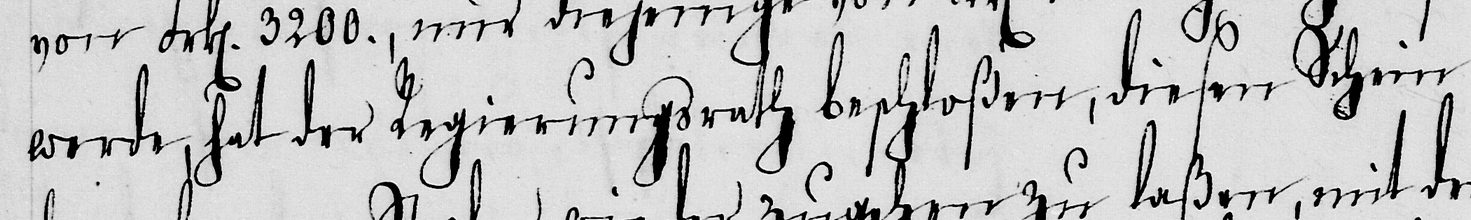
werde, hat der Regierungsrath beschloßen, diesen Schein
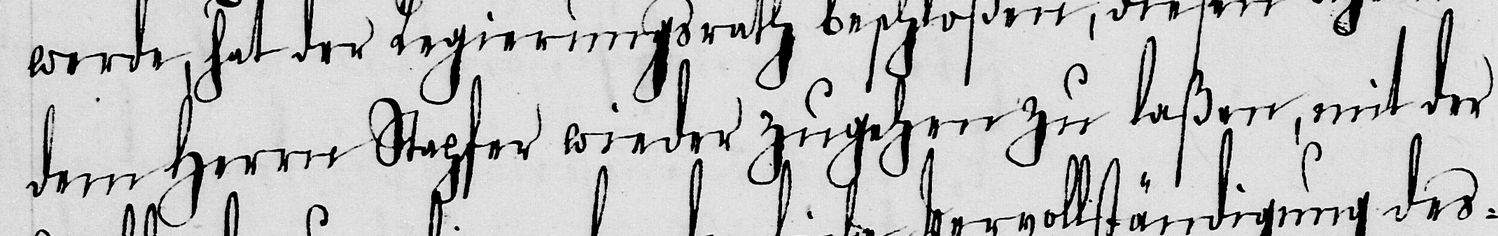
dem Herrn Stapfer wieder zugehen zu laßen, mit der
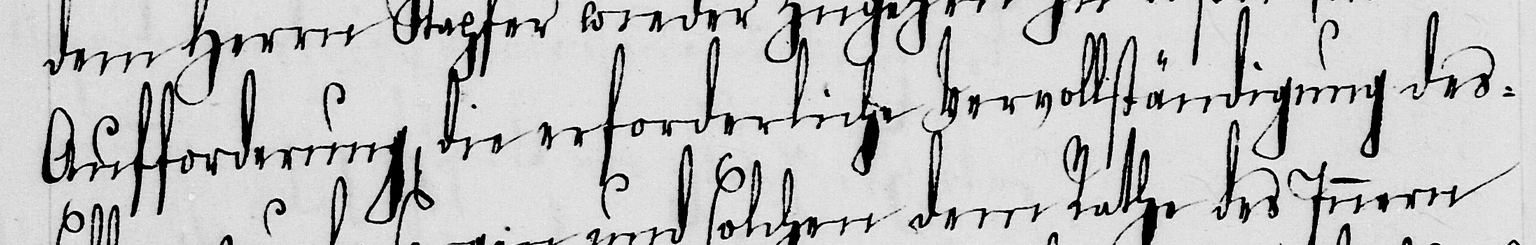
Aufforderung, die erforderliche Vervollständigung des¬
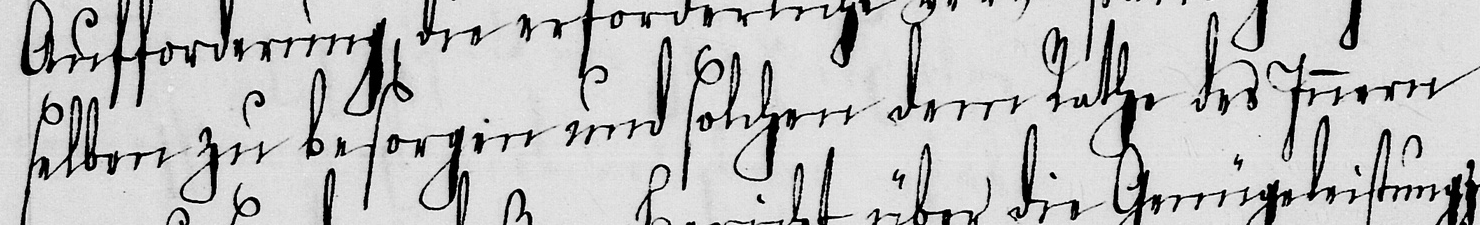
selben zu besorgen und solchen dem Rathe des Innern
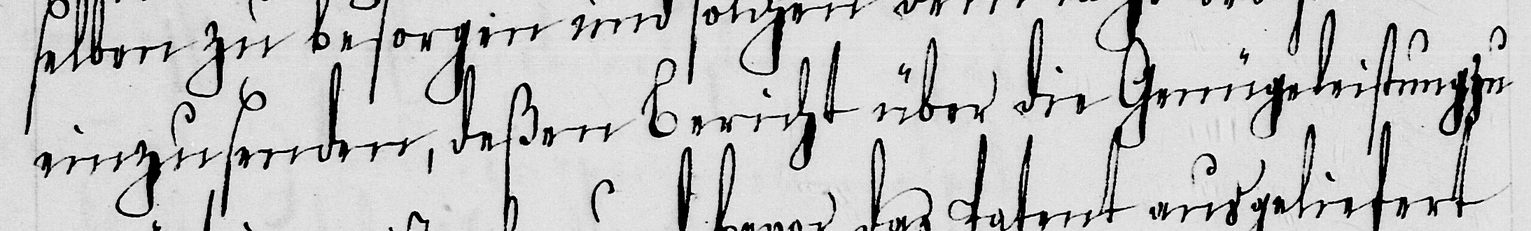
einzusenden, deßen Bericht über die Genügeleistung zu
